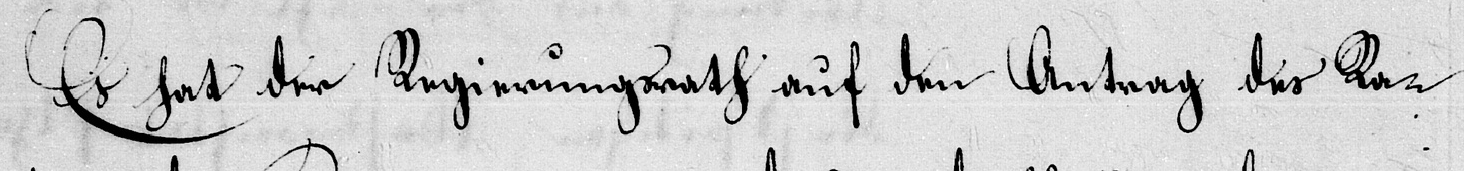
Es hat der Regierungsrath auf den Antrag des Ra¬
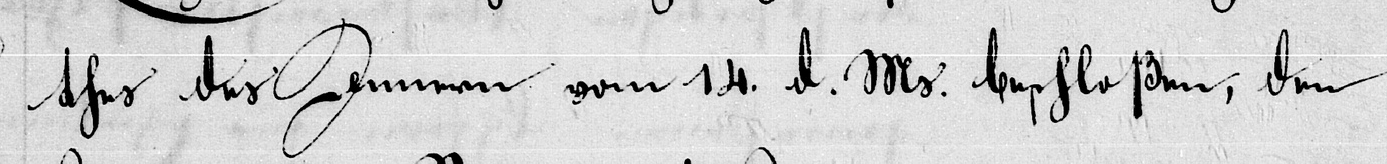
thes des Innern vom 14. d. Ms. beschloßen, den
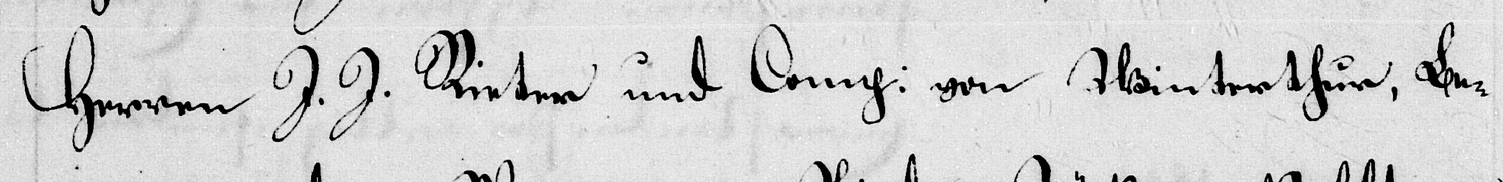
Herren J. J. Rieter und Comp. von Winterthur, Be¬
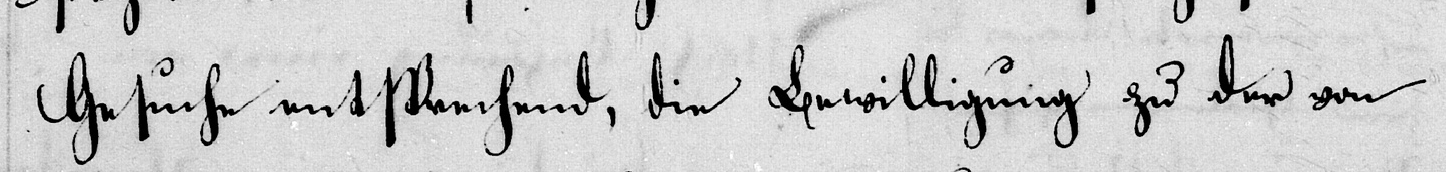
Gesuche entsprechend, die Bewilligung zu der von
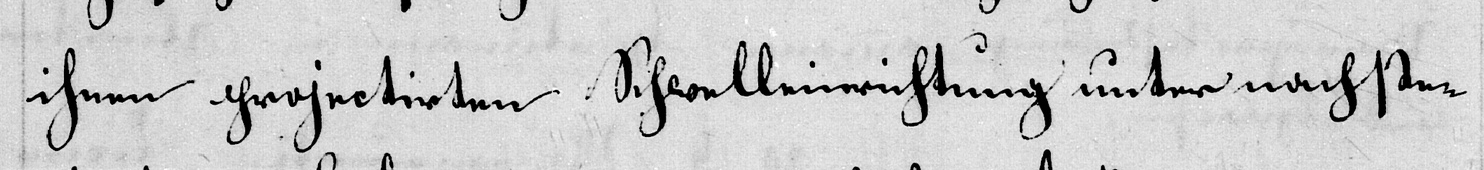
ihnen projectirten Schwelleinrichtung unter nachste¬
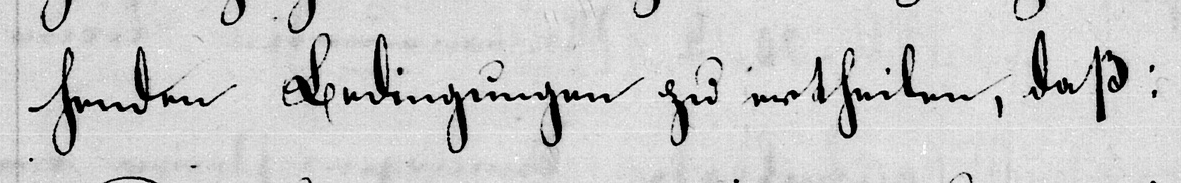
henden Bedingungen zu ertheilen, daß:
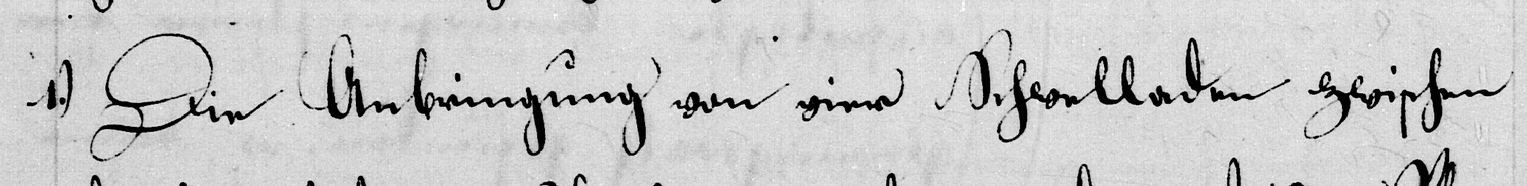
1.) Die Anbringung von vier Schwelladen zwischen
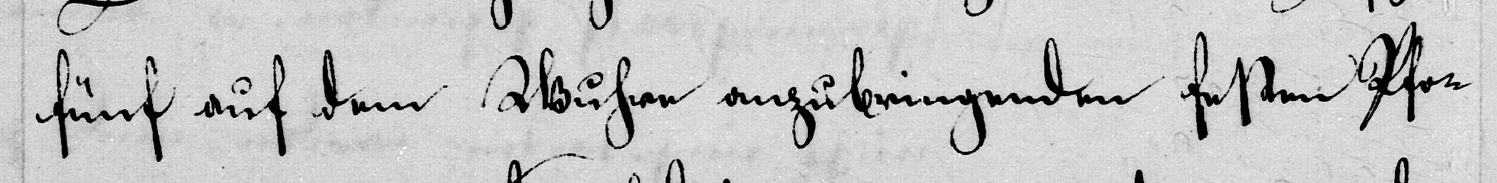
fünf auf dem Wuhre anzubringenden festen Pfo¬
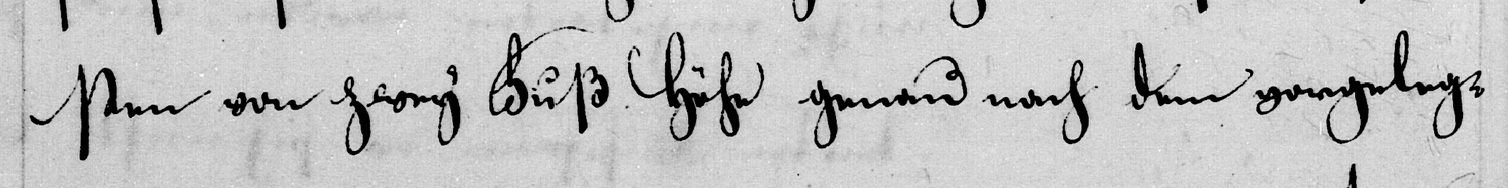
sten von zwey Fuß Höhe genau nach dem vorgeleg-
